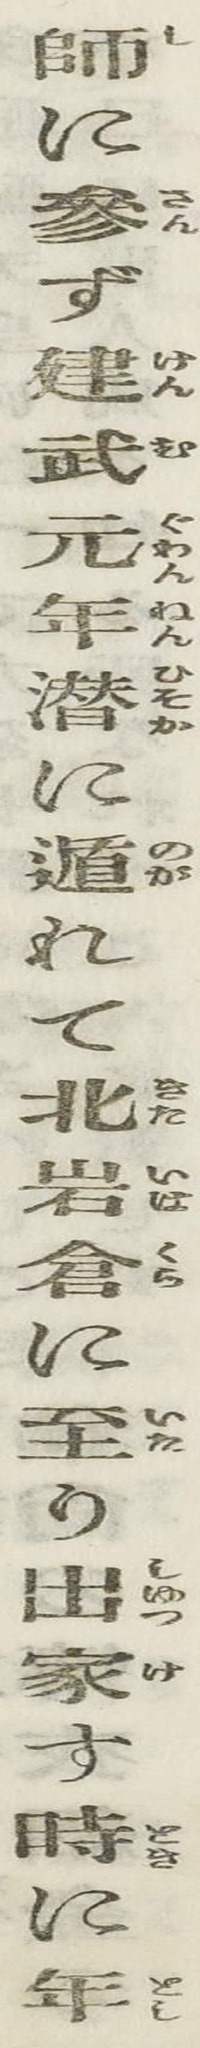師に参ず建武元年潜に遁れて北岩倉に至り出家す時に年
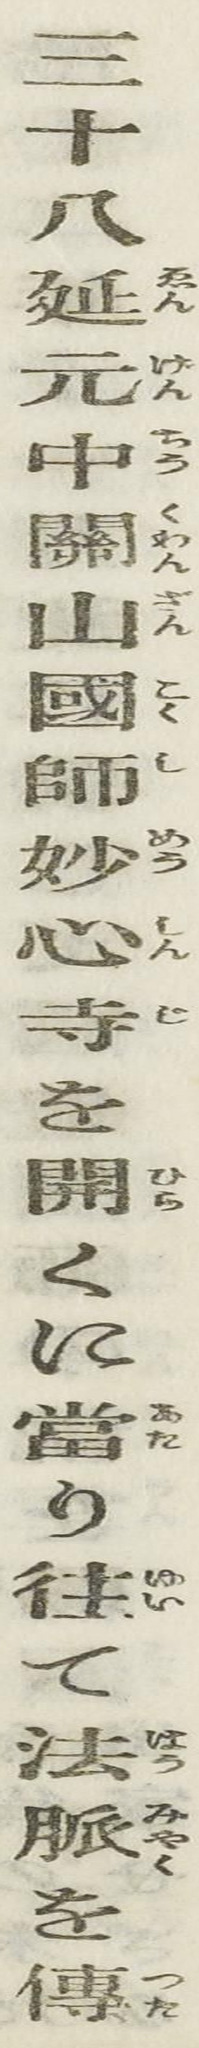三十八延元中關山國師妙心寺を開くに當り往て法脈を伝
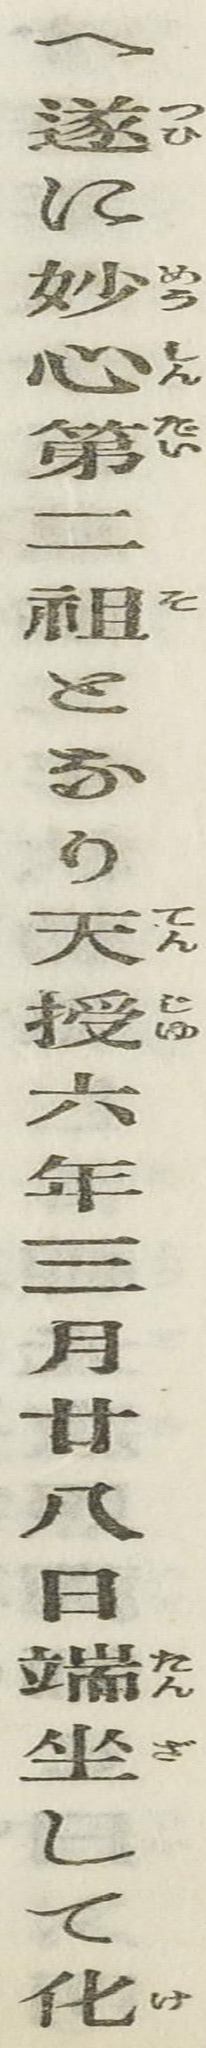へ遂に妙心第二祖となり天授六年三月廿八日端坐して化

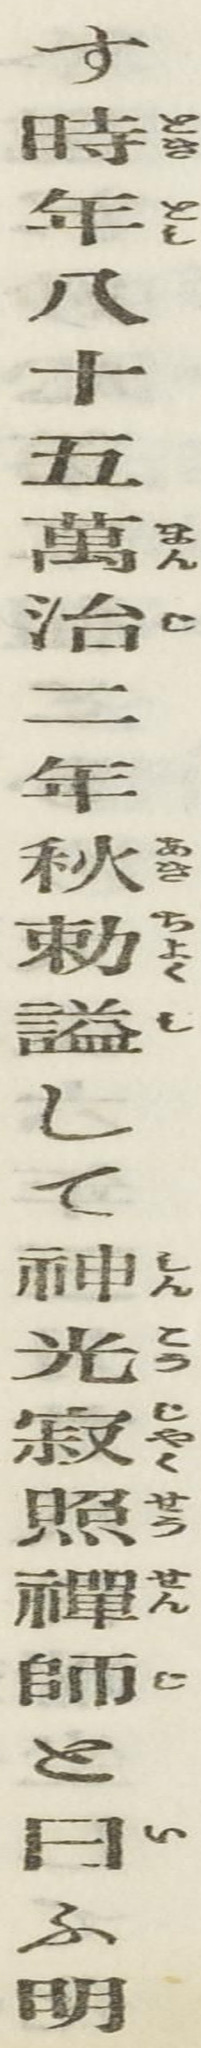す時年八十五萬治二年秋勅謚して神光寂照禅師と曰ふ明
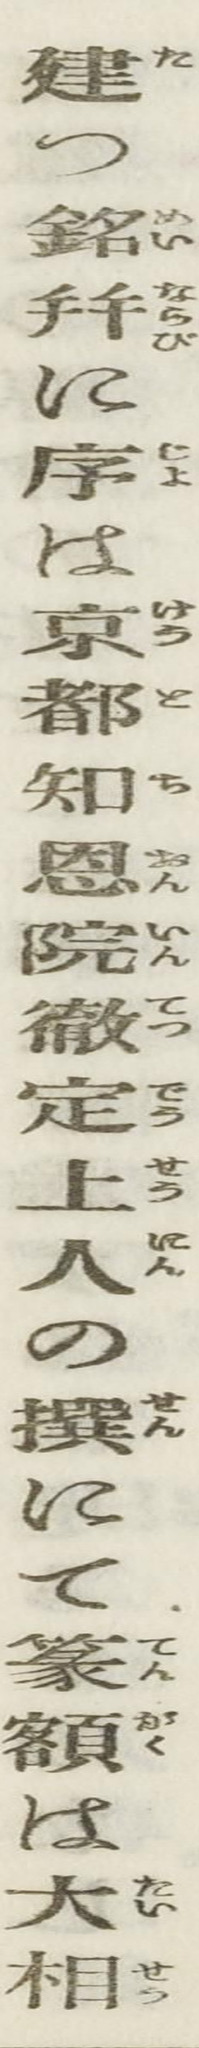建つ銘并に序は京都知恩院徹定上人の撰にて篆額は大相
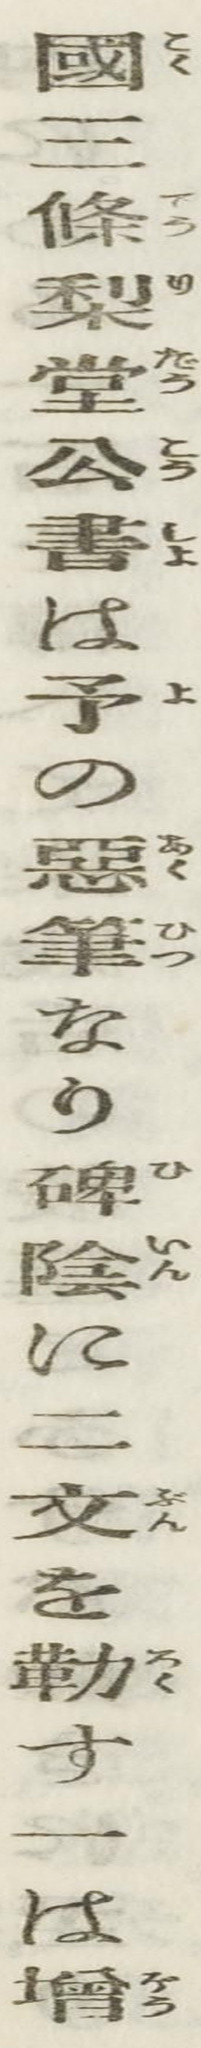國三條梨堂公書は予の悪筆なり碑陰に二‘文を勒す一は増
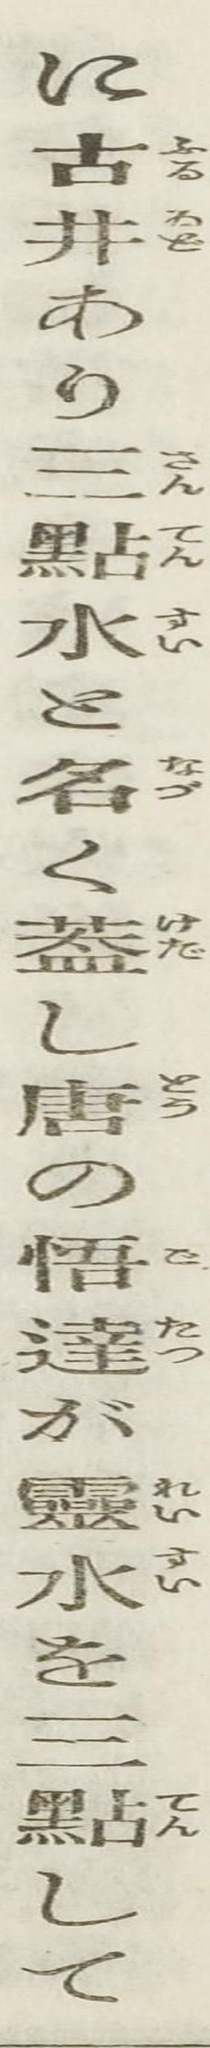に古井あり三點水と名く蓋し唐の悟達が霊水を三點して
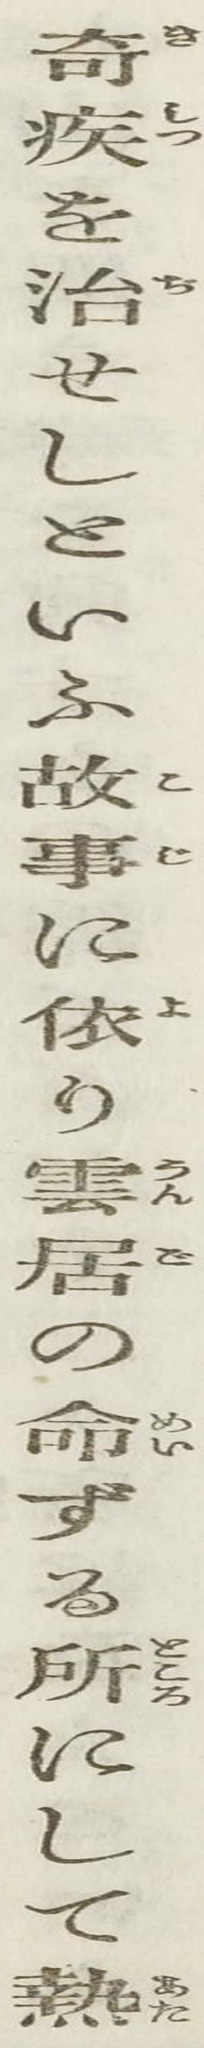奇疾を治せしといふ故事に依り雲居の命ずる所にして熱
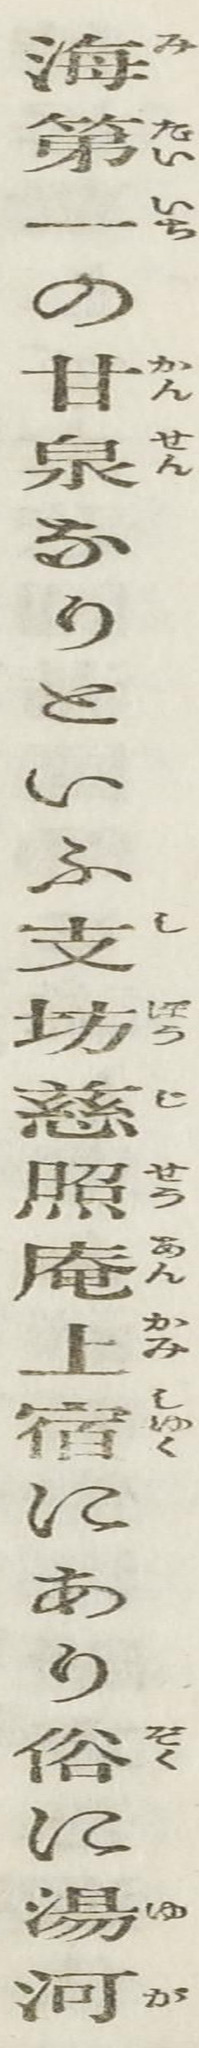海第一の甘泉なりといふ支坊慈照庵上宿にあり俗に湯河
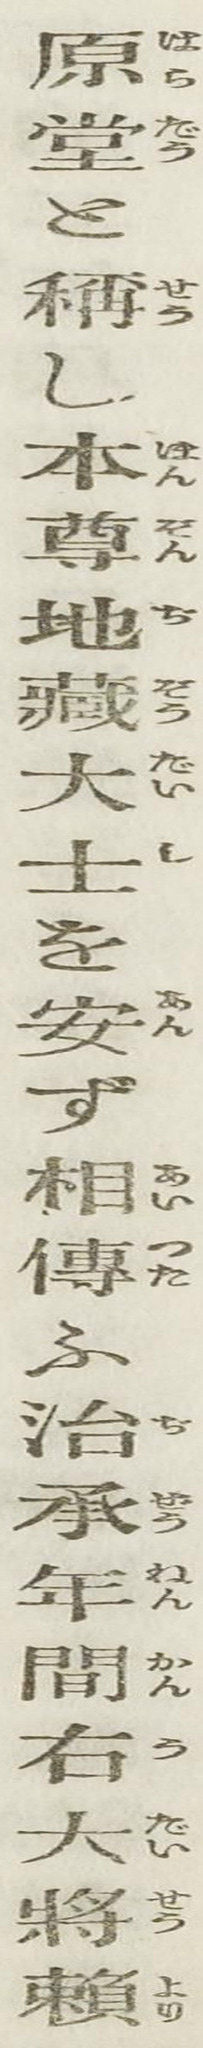原堂と称し本尊地蔵大士を安ず相伝ふ治承年間右大将頼
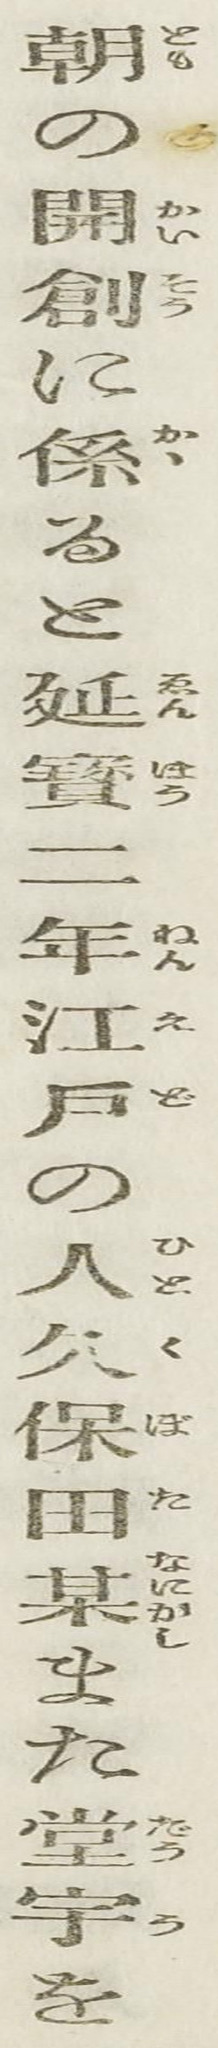朝の開創に係ると延宝二年江戸の人久保田某また堂宇を
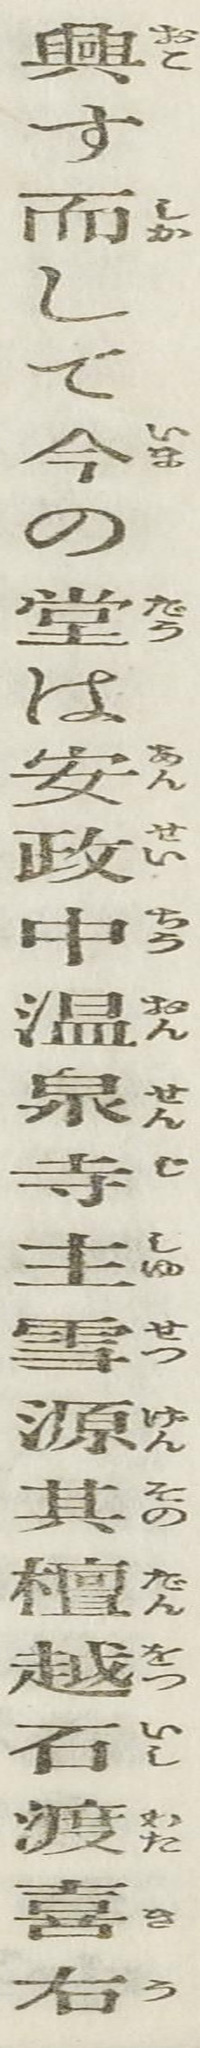興す而して今の堂は安政中温泉寺主雪源其檀越石渡喜右
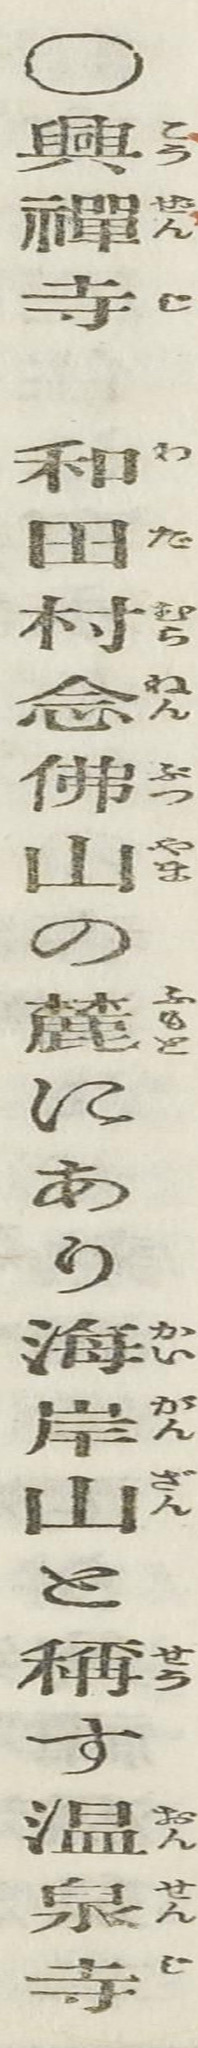○興禪寺和田村念佛山の麓にあり海岸山と称す温泉寺
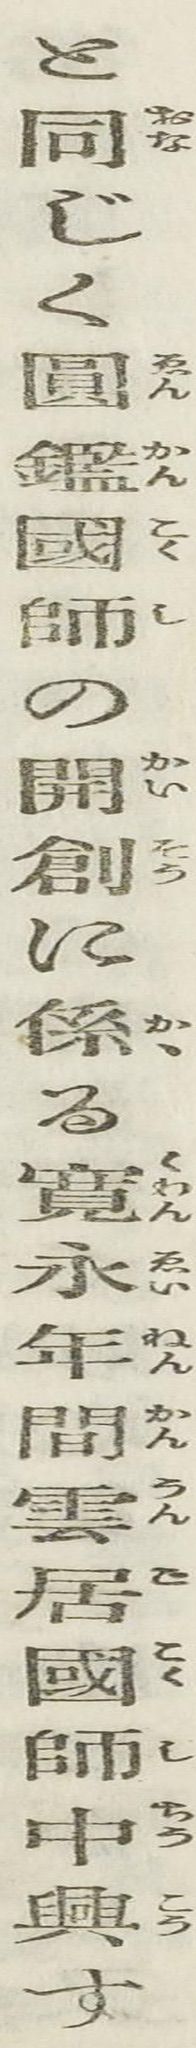と同じく圓鑑國師の開創に係る寛永年間雲居國師中興す
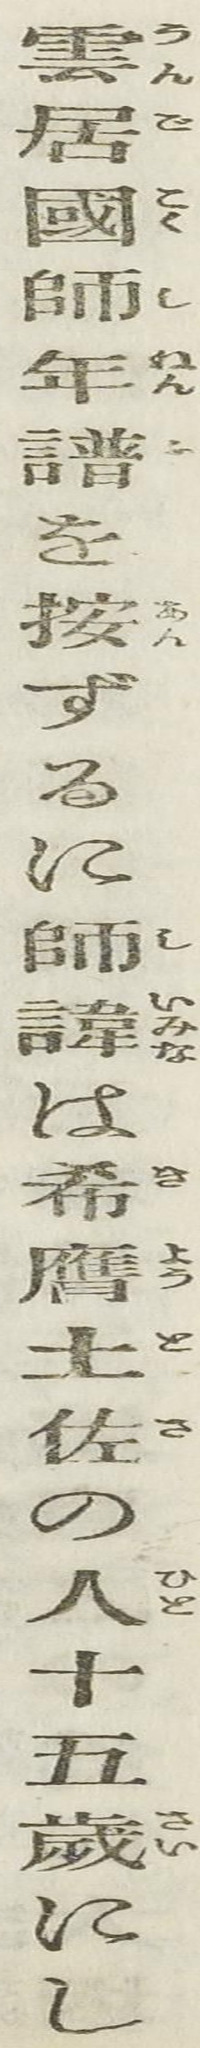雲居國師年譜を按ずるに師諱は希膺土佐の人十五歳にし

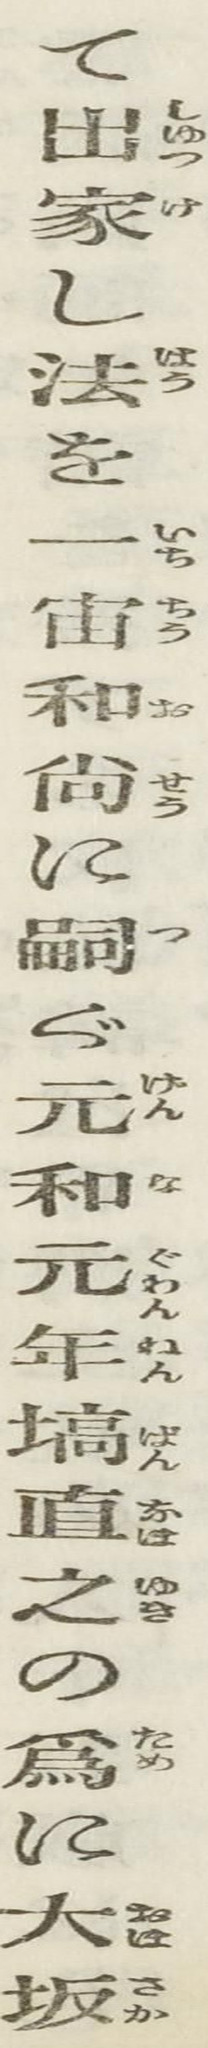て出家し法を一宙和尚に嗣ぐ元和元年塙直之の為に大坂
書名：熱海獨案内　全
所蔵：東京大学地震研究所図書室 Earthquake Research Institute Library, The University of Tokyo, JAPAN
